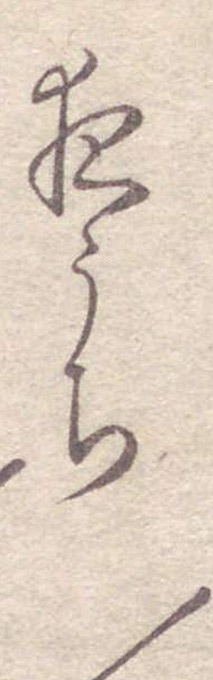夜うち

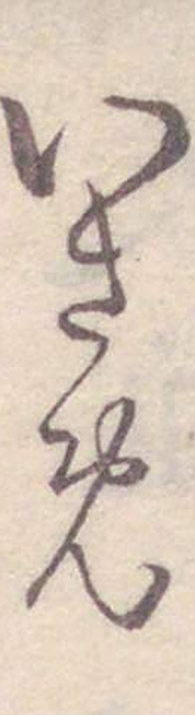いさめ
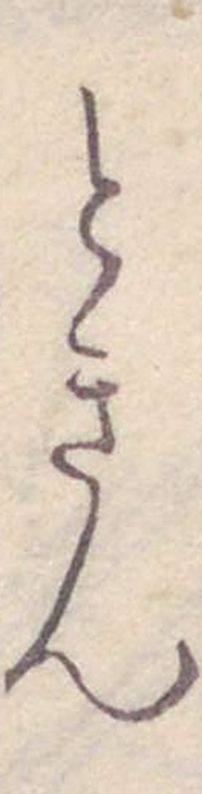ときん
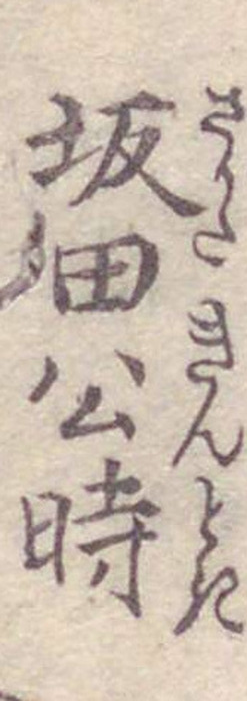坂田公時
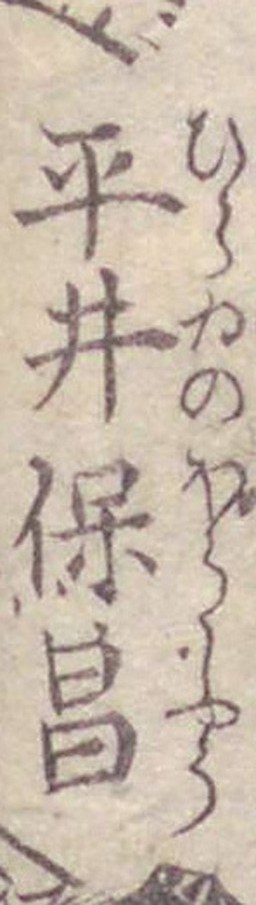平井保昌
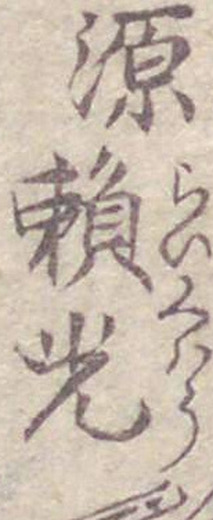源頼光

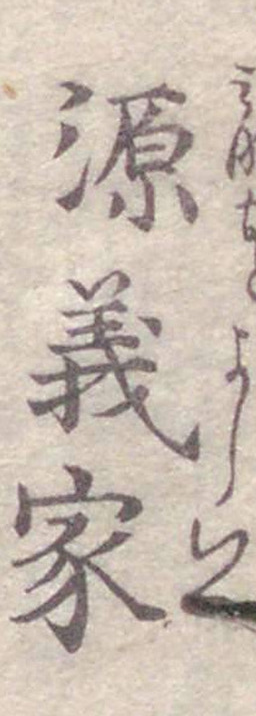源義家
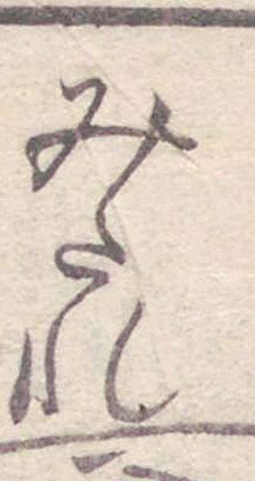みたれ

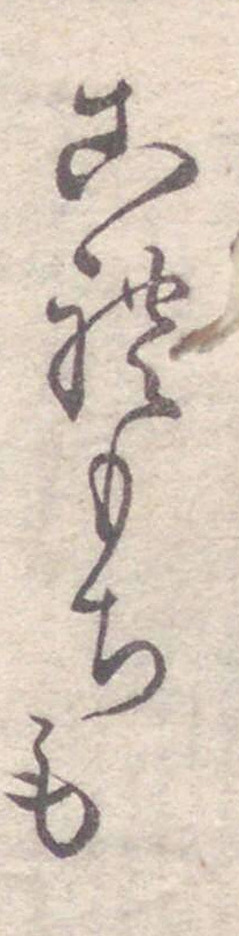これもちも
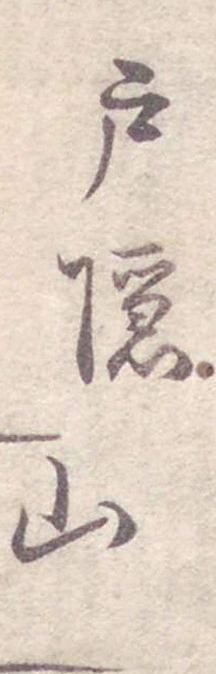戸隠山
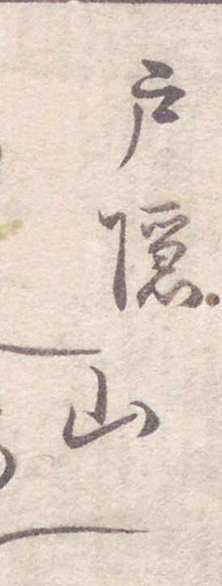戸隠山
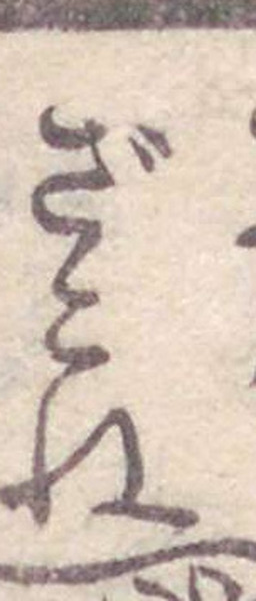ざこね

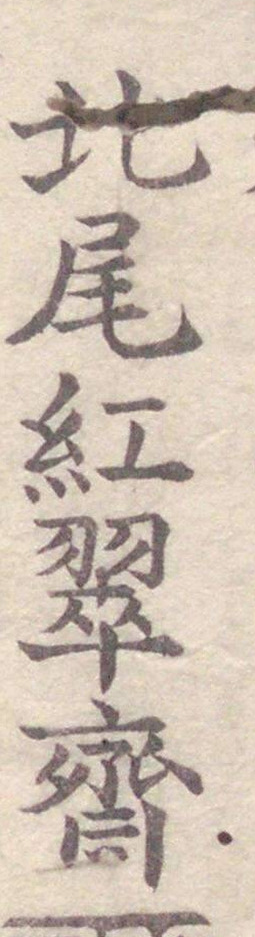北尾紅翠斎
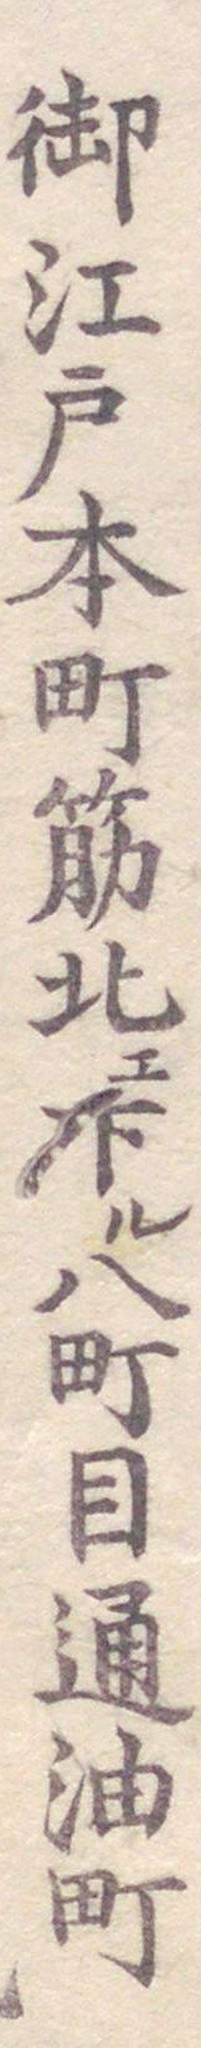書林御江戸本町筋北ヘ下ル八町目通油町
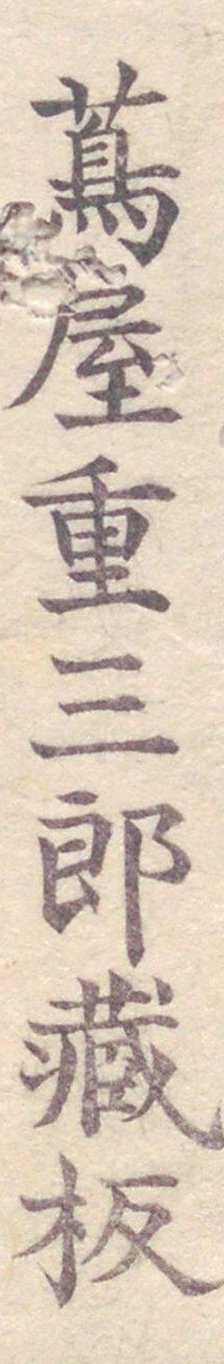蔦屋重三郎蔵板
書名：繪本八十宇治川
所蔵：九州大学中央図書館 国文学研究資料館
